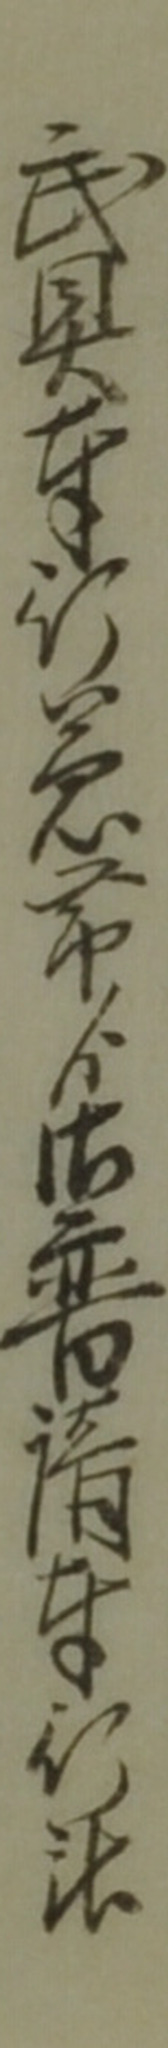武具奉行兼帯ゟ御普請奉行被
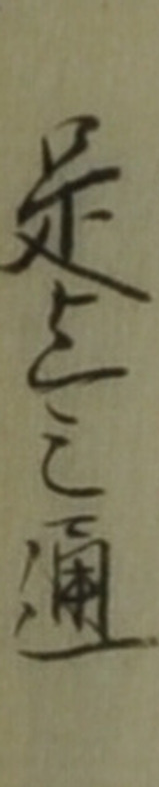是迄之通
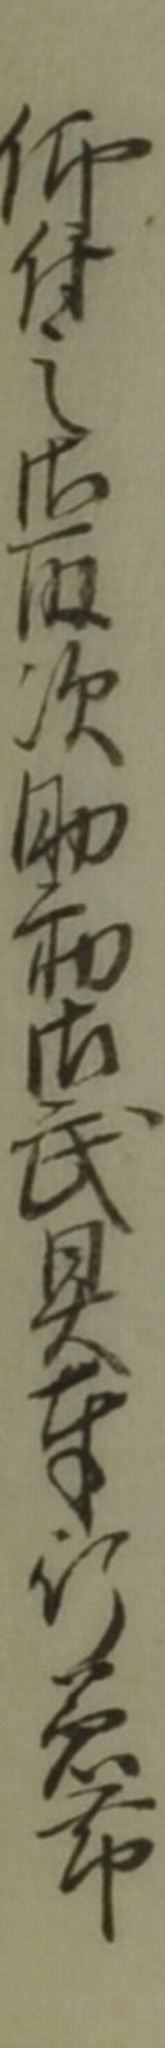仰付之御取次助勤御武具奉行兼帯
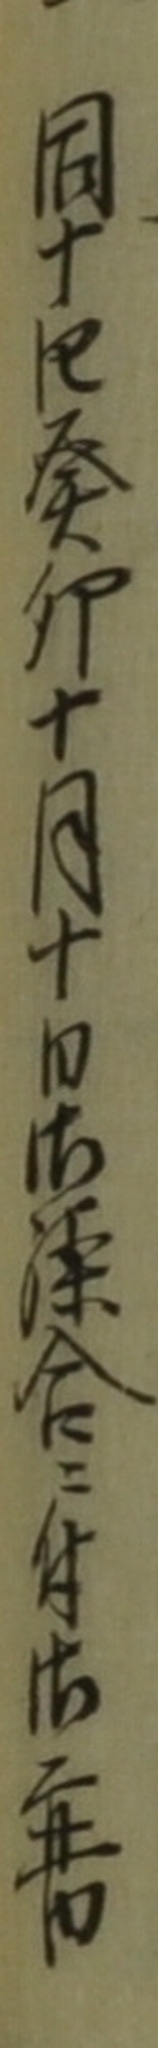一同十四癸卯十月十日御繰合ニ付御普
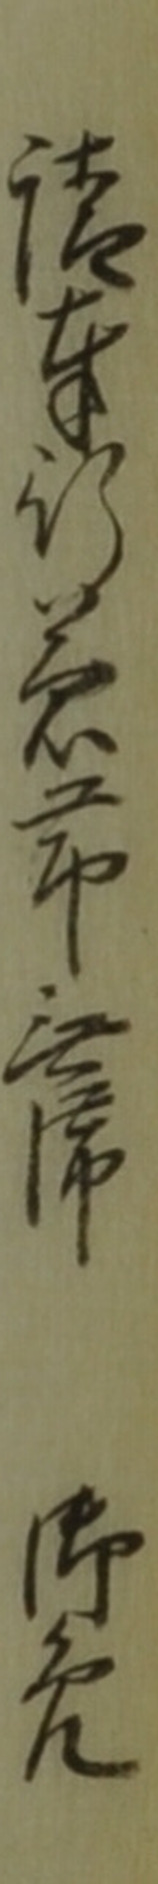請奉行兼帯無滞御免
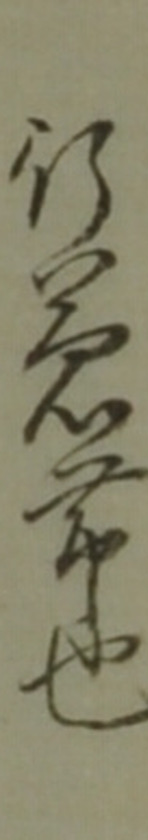行兼帯也
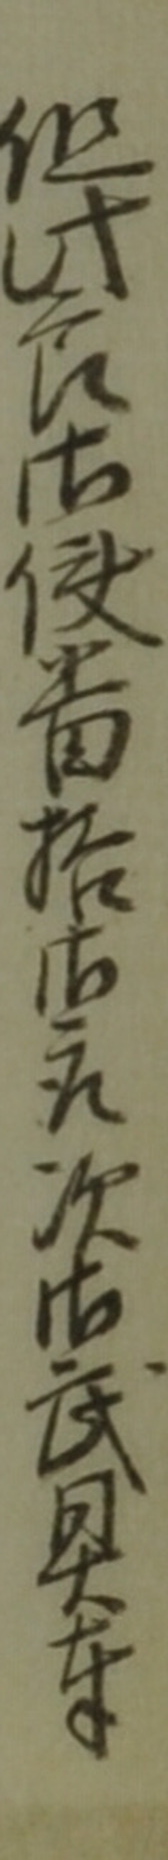但此節御使番格御取次御武具奉
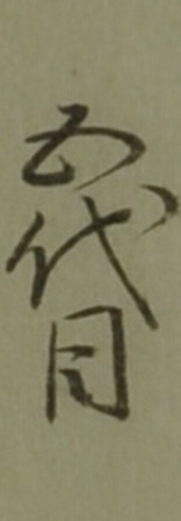五代目
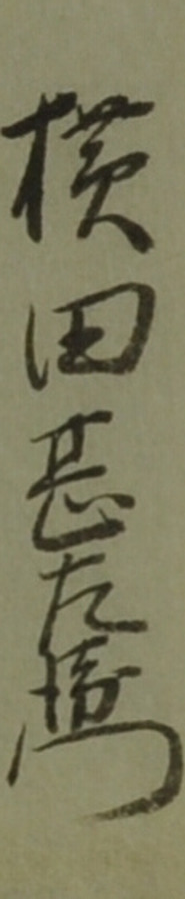横田甚左衛門
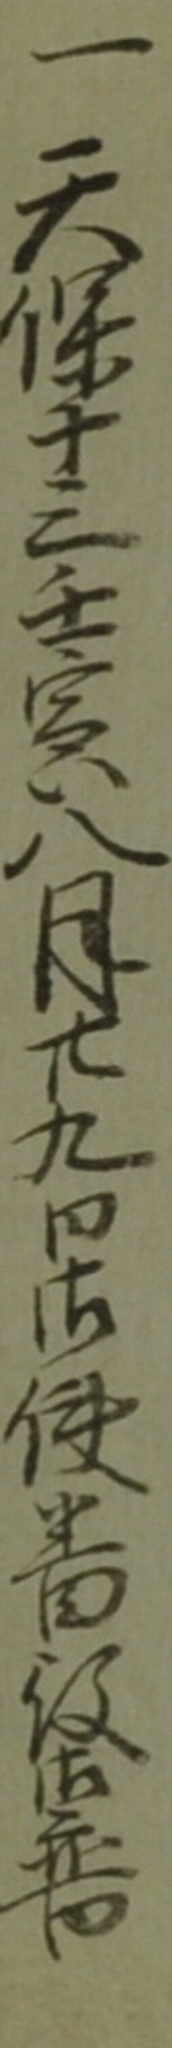一天保十三壬寅八月廿九日御使番役御普
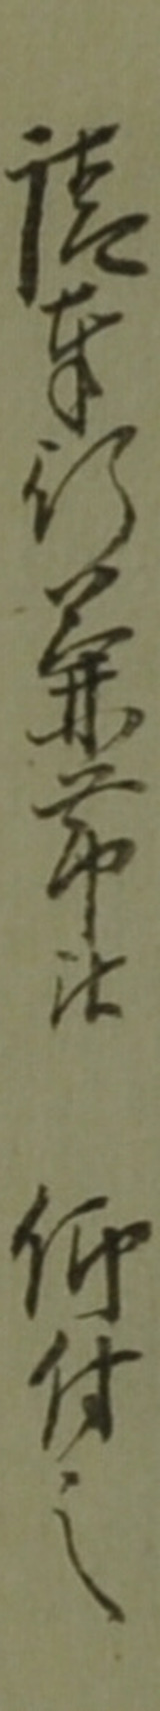請奉行兼帯被仰付之
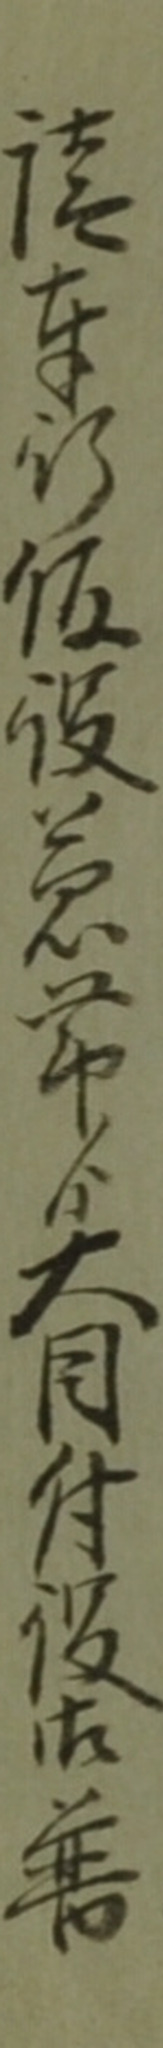請奉行仮役兼帯ゟ大目付役御普
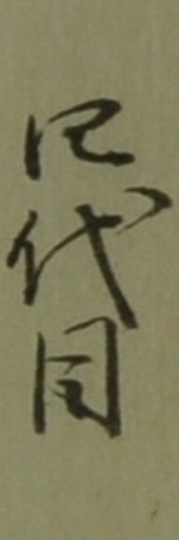四代目
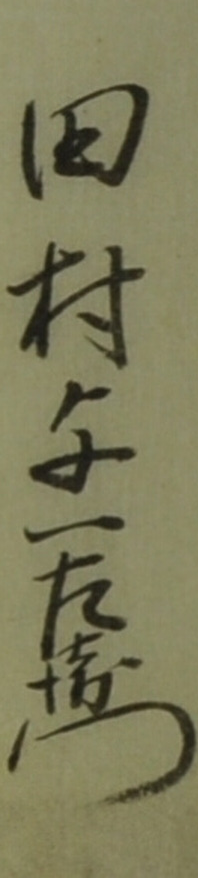田村与一左衛門

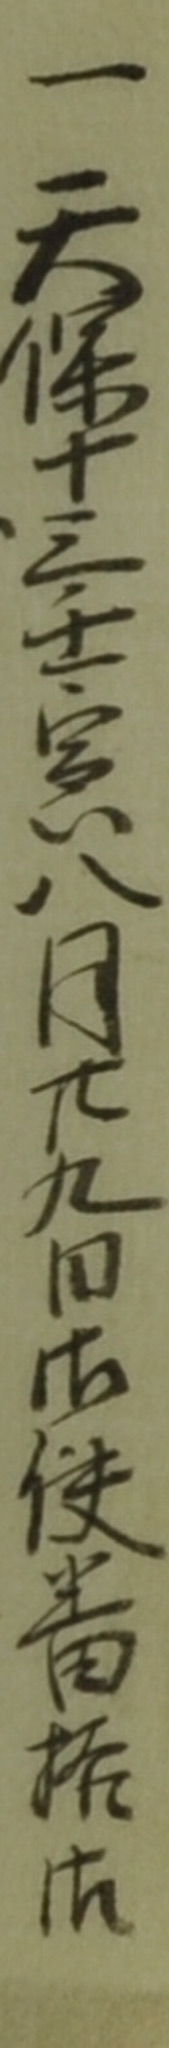一天保十三壬寅八月廿九日御使番格御
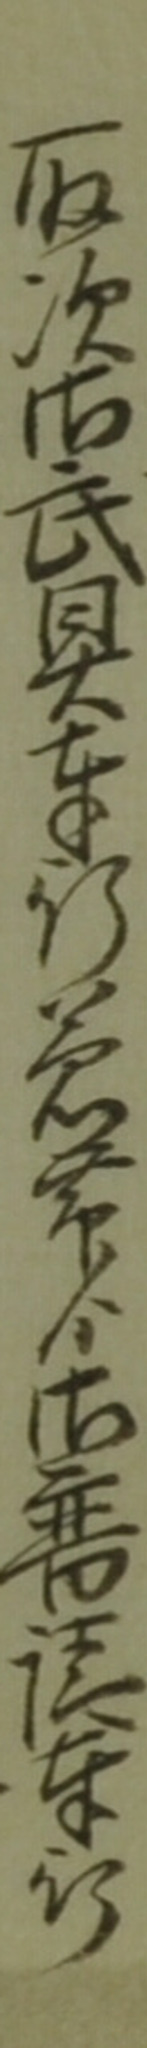取次御武具奉行兼帯ゟ御普請奉行
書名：諸御役代々録（六）
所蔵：伊那市立高遠町図書館・合同会社AMANE
